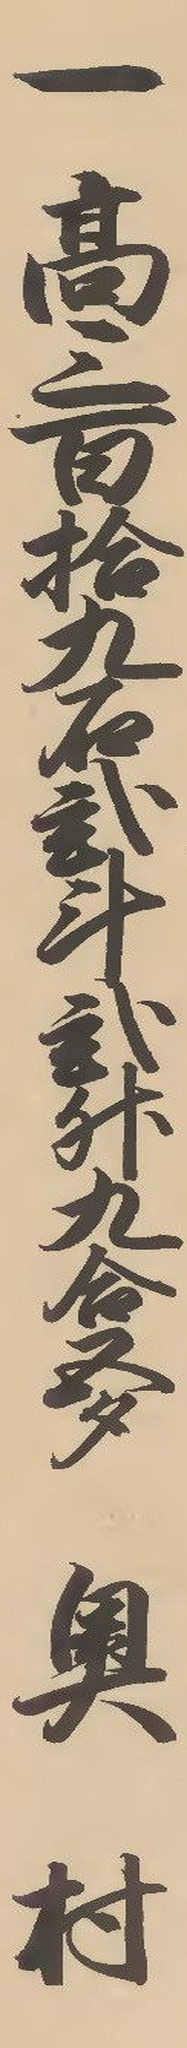一高三百拾九石弐斗弐升九合五勺奥村
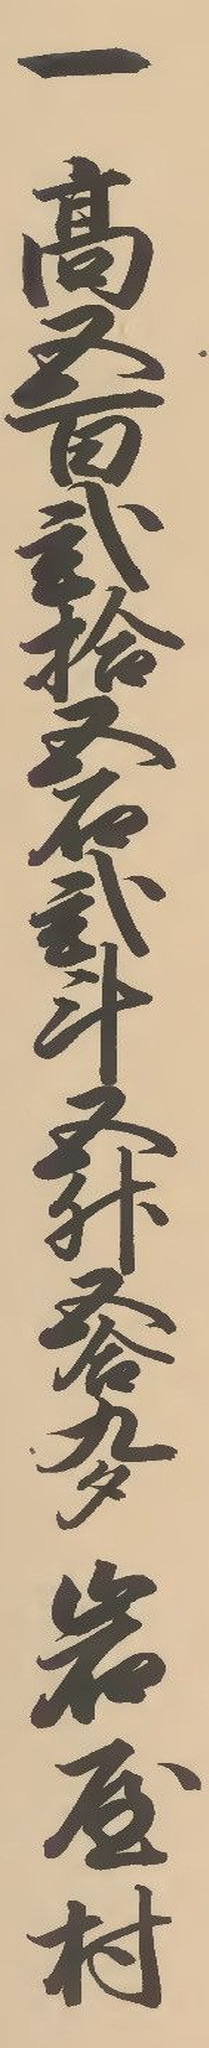一高五百弐拾五石弐斗五升九勺岩屋村
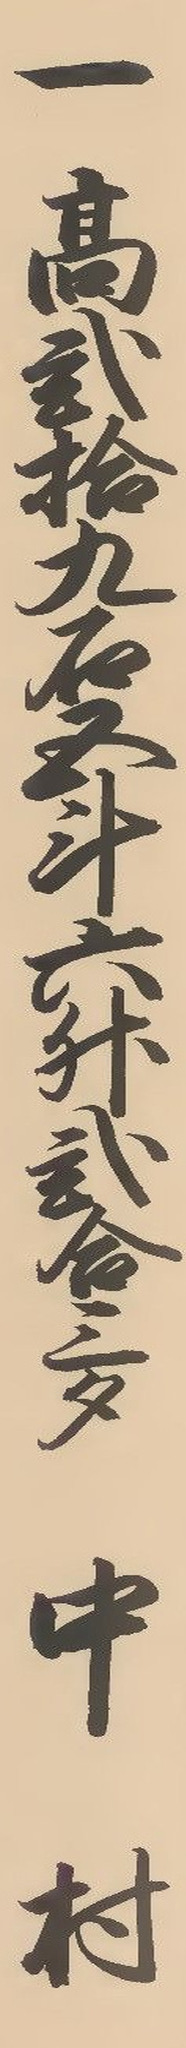一高弐拾九石五斗六升弐合三勺中村
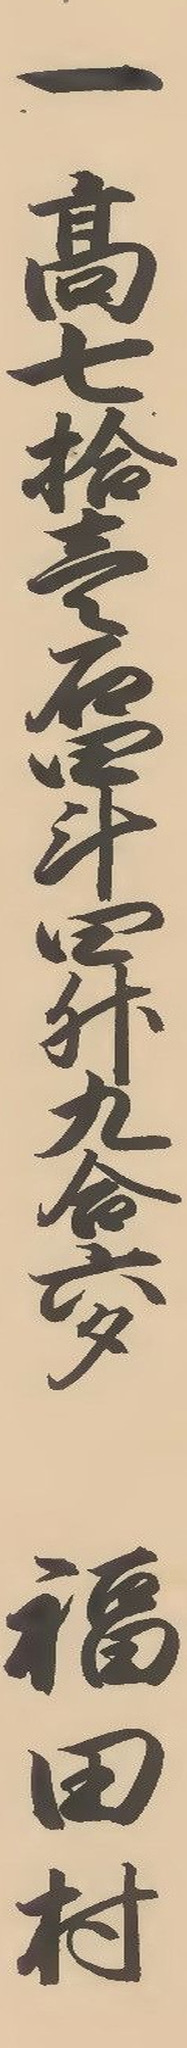一高七拾壱石四斗四升九合六勺福田村
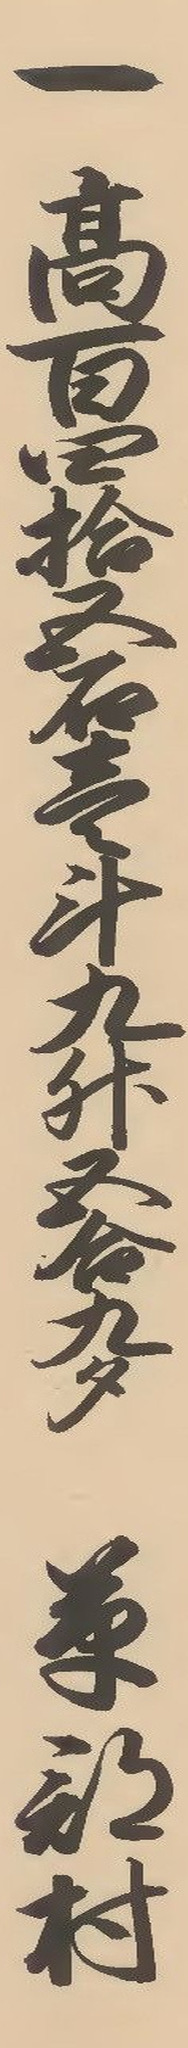一高百四拾五石壱斗九升五合九勺草部村
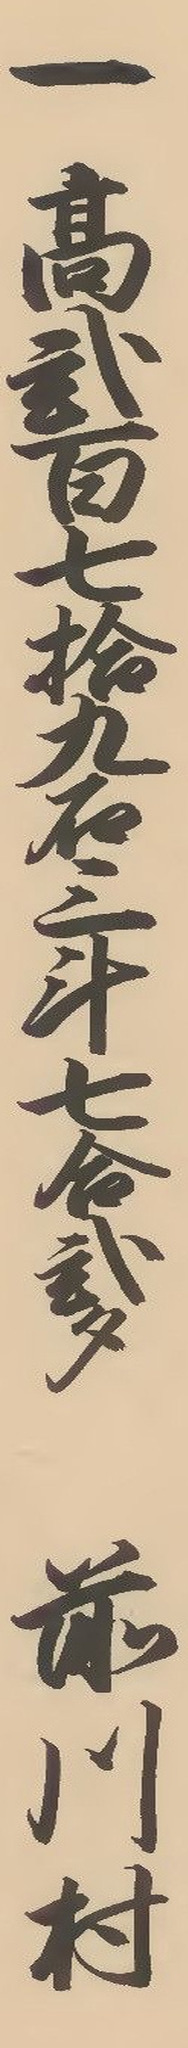一高弐百七拾九石三斗七合弐勺前川村

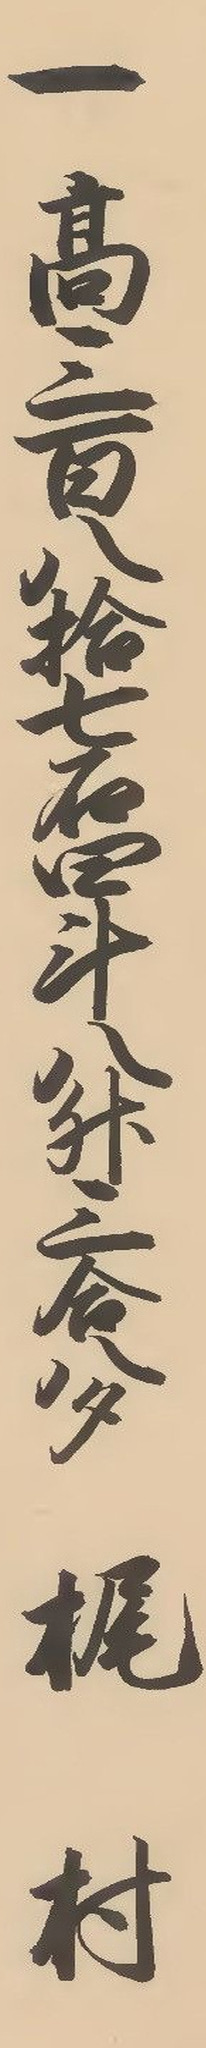一高三百八拾七石四斗八升三合八勺梶村
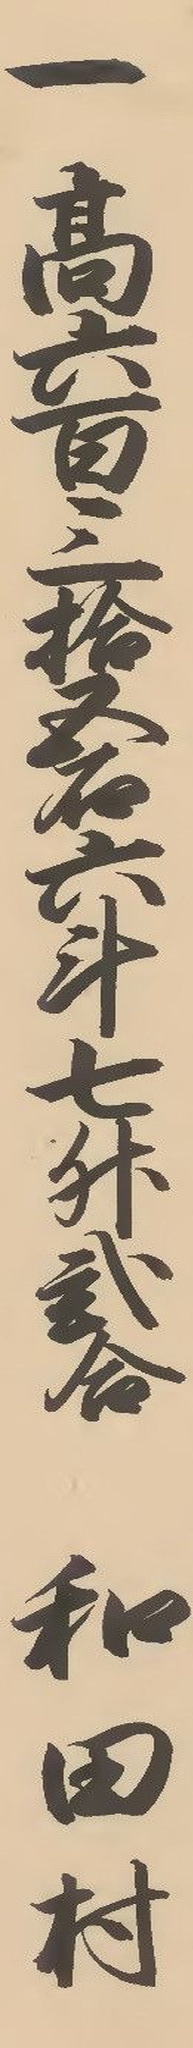一高六百三拾五石六斗七升弐合和田村
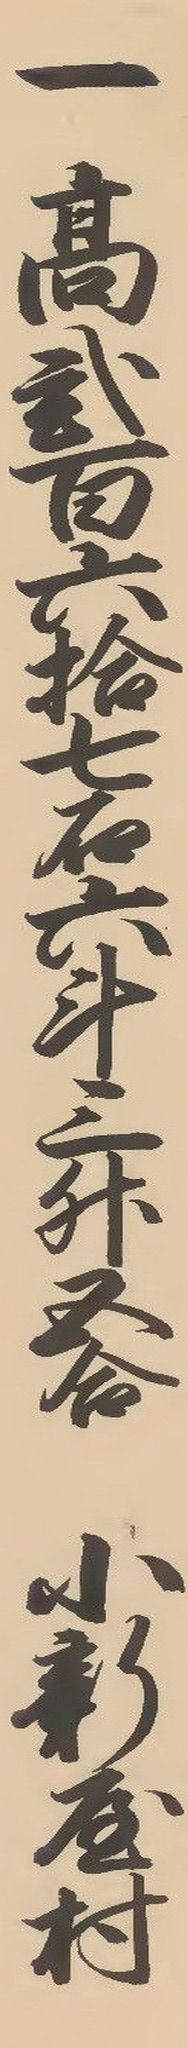一高弐百六拾七石六斗三升五合小新屋村
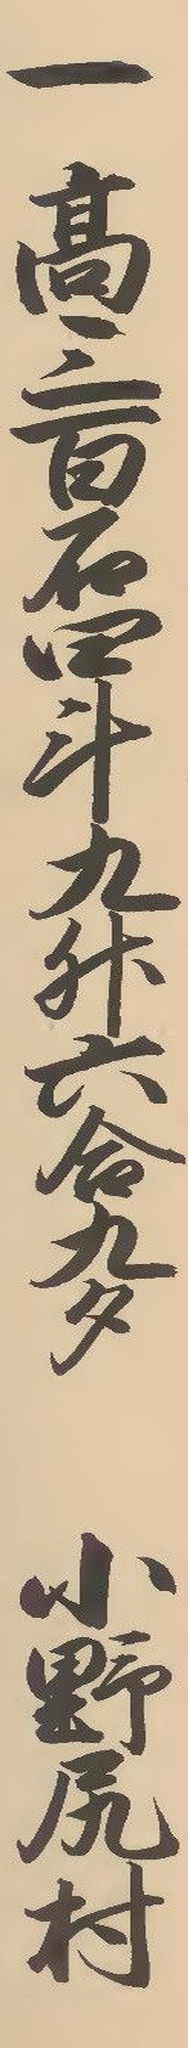一高三百石四斗九升六合九勺小野尻村
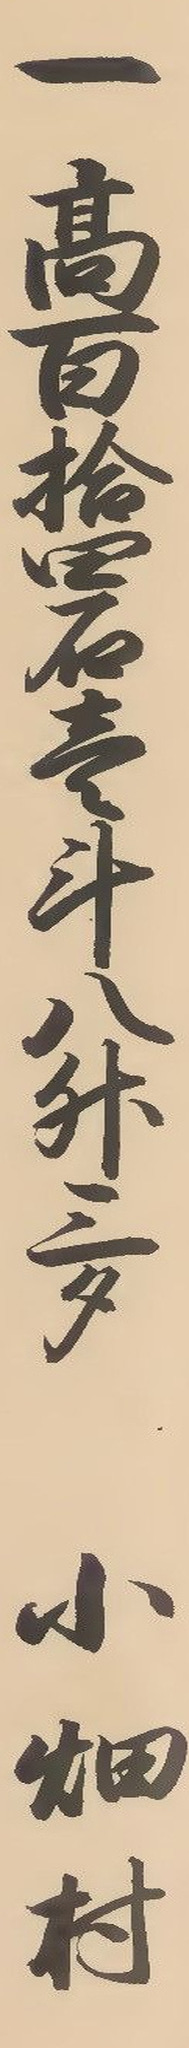一高百拾四石壱斗八升三勺小畑村
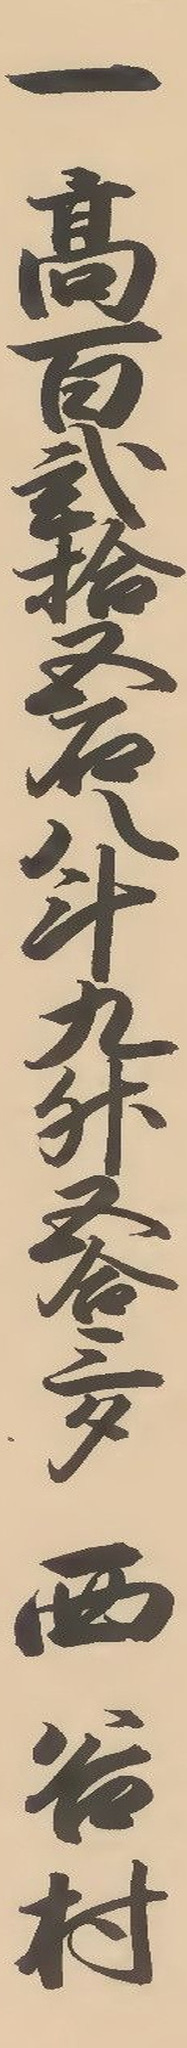一高百弐拾五石八斗九升五合三勺西谷村
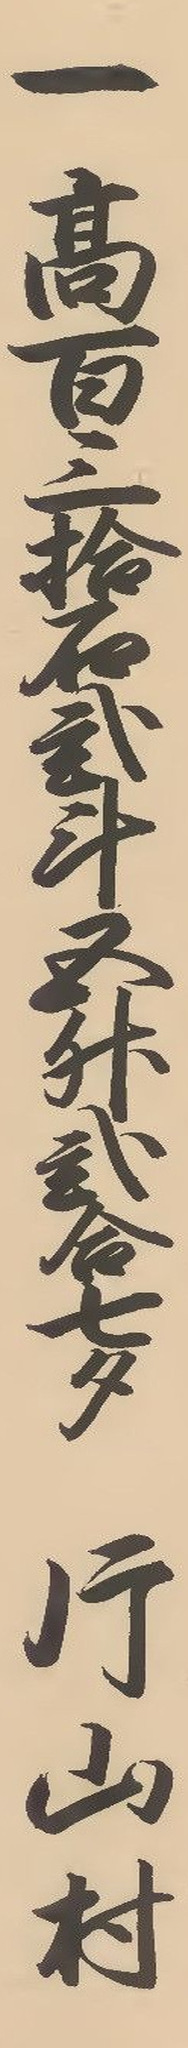一高百三拾石弐斗五升弐合七勺片山村
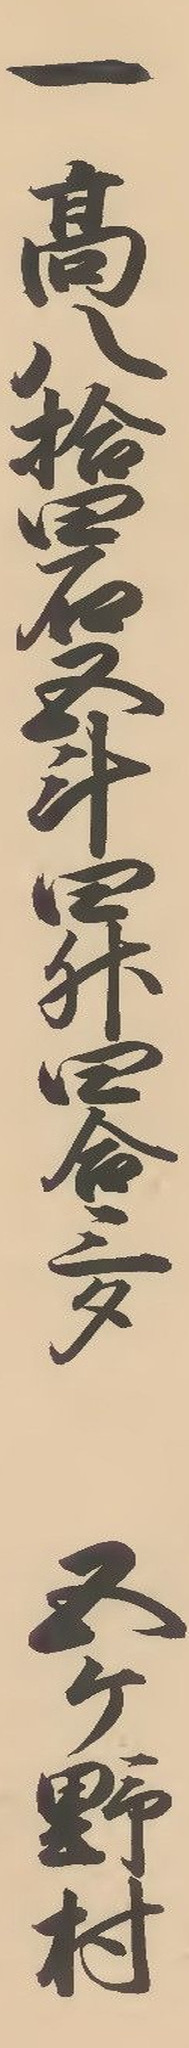一高八拾四石五斗四升四合三勺五ヶ野村

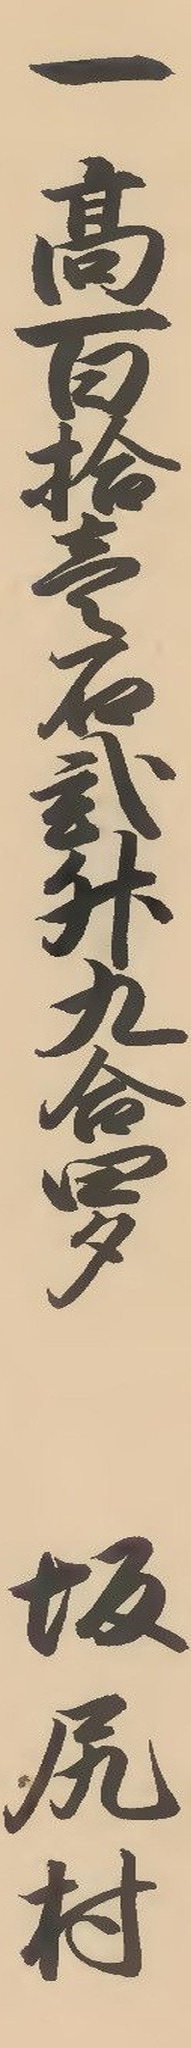一高百拾壱石弐升九合四勺坂尻村
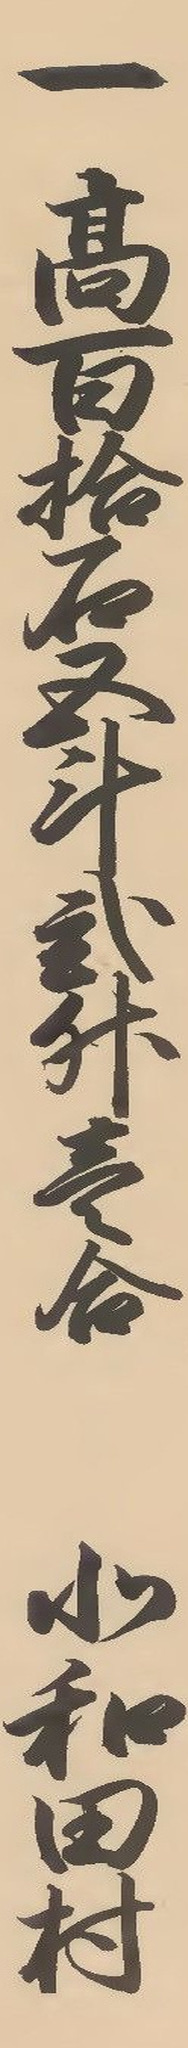一高百拾石五斗弐升壱合北和田村
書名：丹波国郷帳
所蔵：国立公文書館 National Archives of Japan
